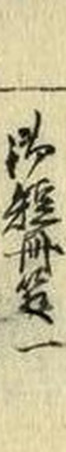御短冊箱一
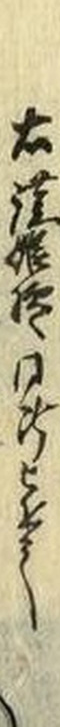右謹姫様へ同断被進之
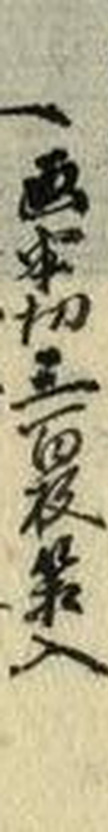画半切三百枚箱入
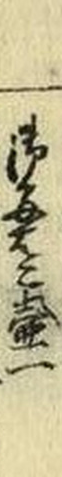御たばこ壺一
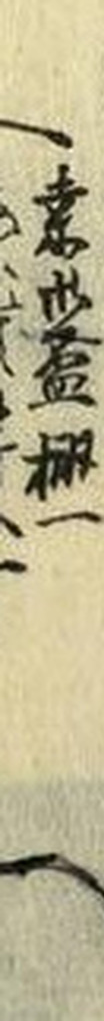桑御盃棚一
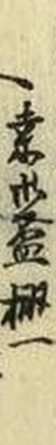桑御盃棚一
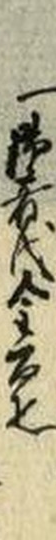御肴代金百疋
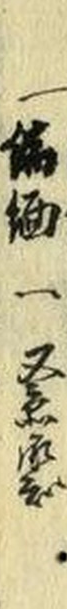縮緬一又兵衛承知
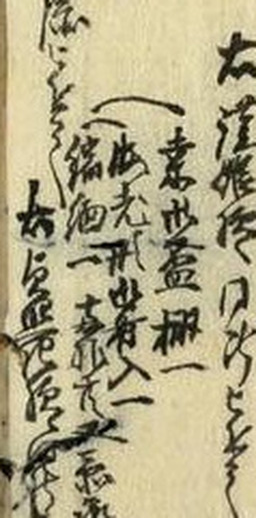海老形御肴入一
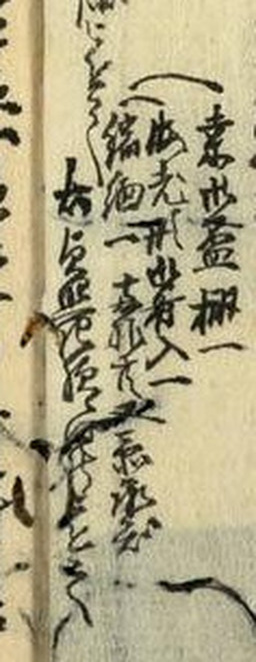縮緬一両様共又兵衛承知
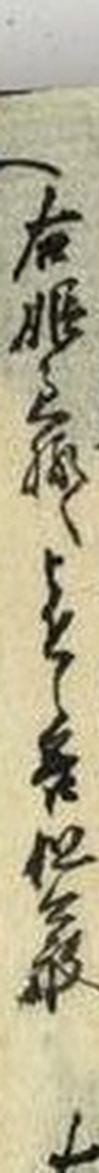右姫君様へ被進之筈但今般
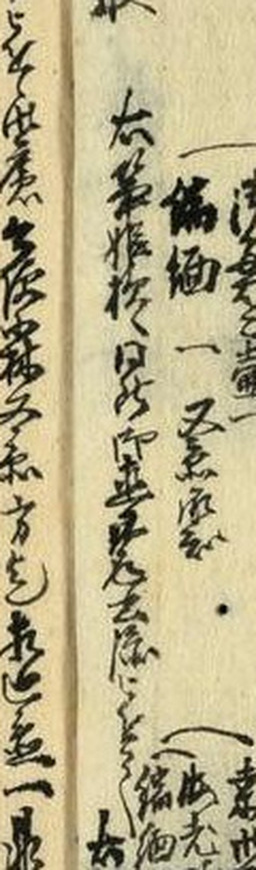右筆姫様へ同断御直御返書添被進之
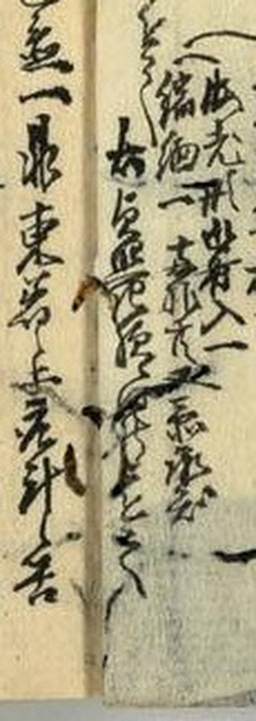右貞照院様へ同断被進之
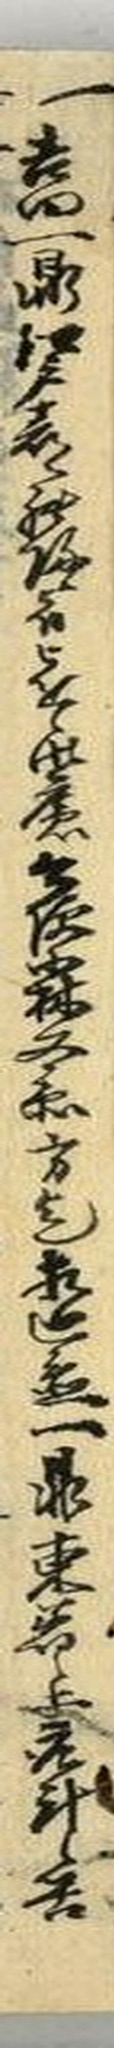吉田一鼎江戸表へ罷帰候ニ付被進候御廉今便小林又兵衛方迄相廻置一鼎東着之上取計候筈
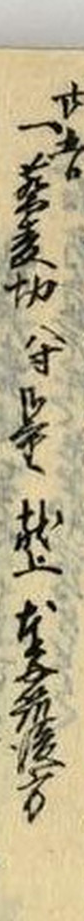一蕎麦切八寸御重献上本多筑後方
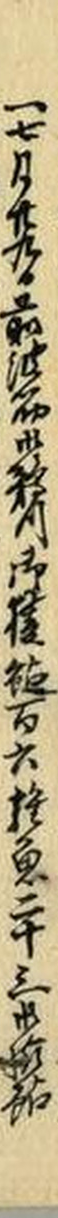一七月廿九日前波筋御鵜川御獲鮎百六雑魚二十三御播鮎
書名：少傅日録抄（斉承付側向頭取日記、在国）
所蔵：福井県文書館 Fukui Prefectural Archives
